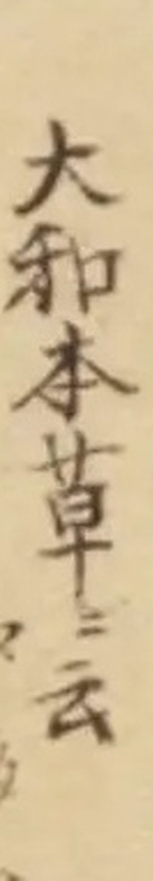大和本草に云
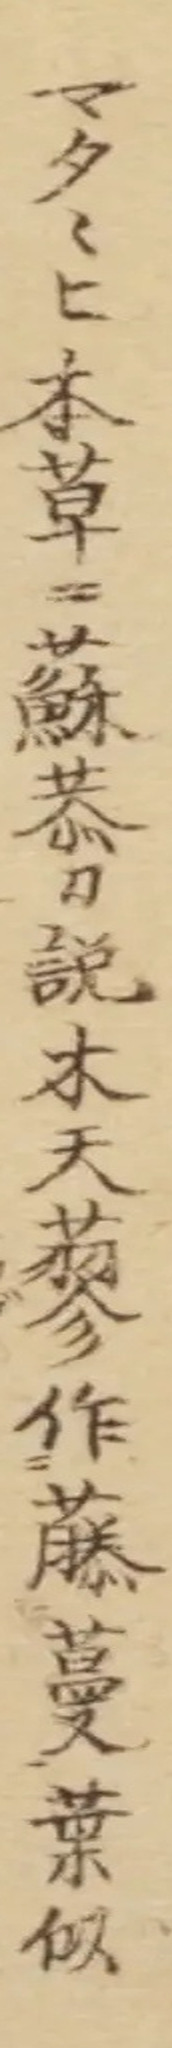またヽひ本草に蘇恭か説木天蓼作藤蔓似
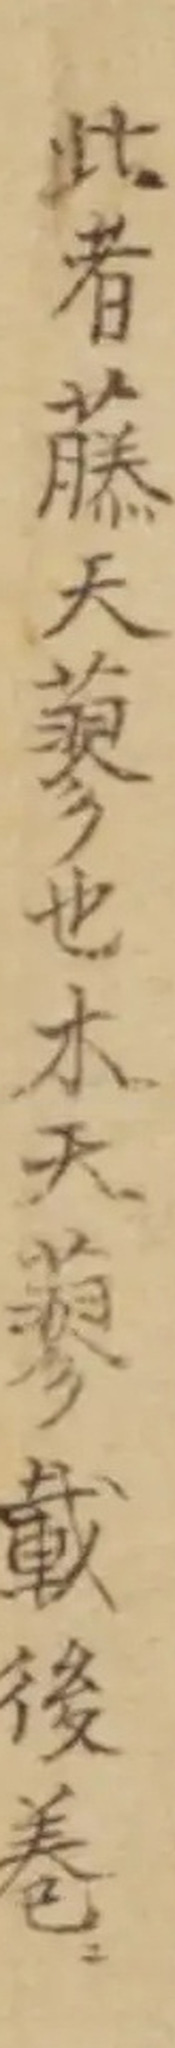此の者藤天蓼也木天蓼載後巻に

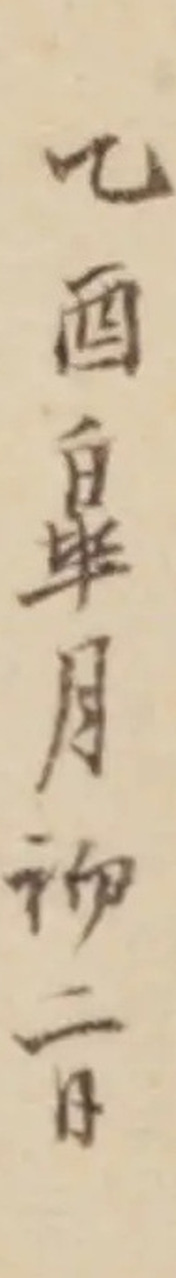乙酉皐月初二日
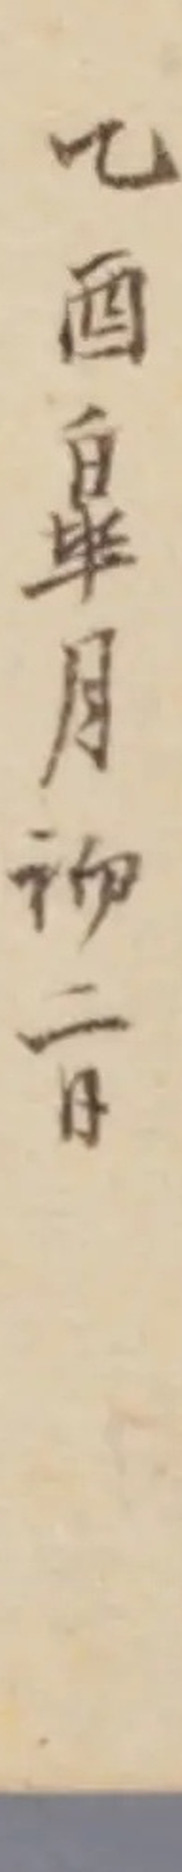乙酉皐月初二日
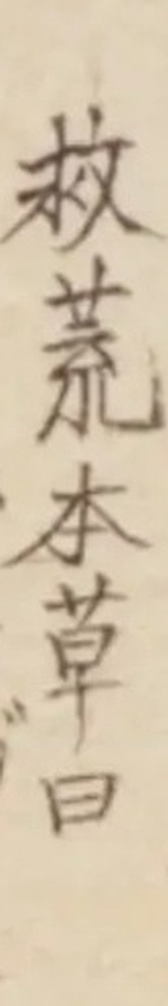救荒本草曰
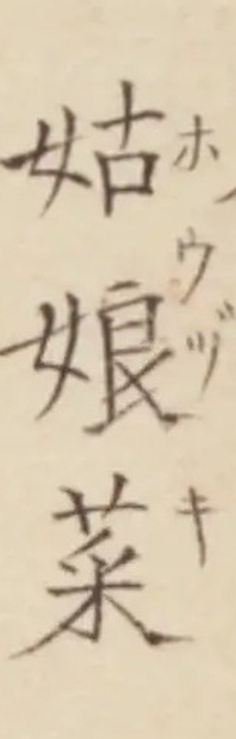姑娘菜
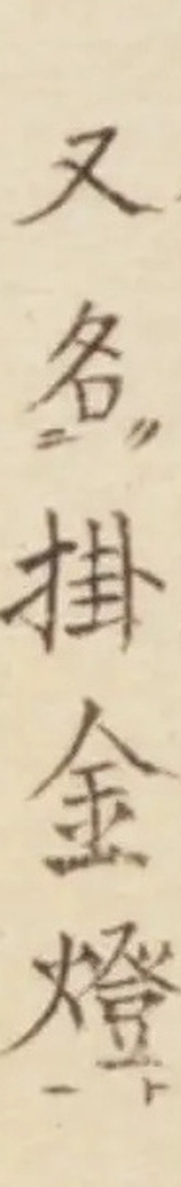又名く掛金燈と
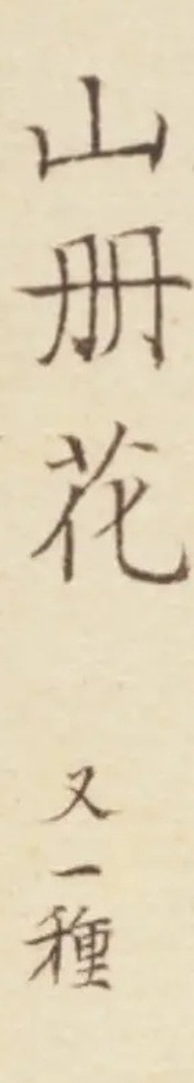山丹花又一種
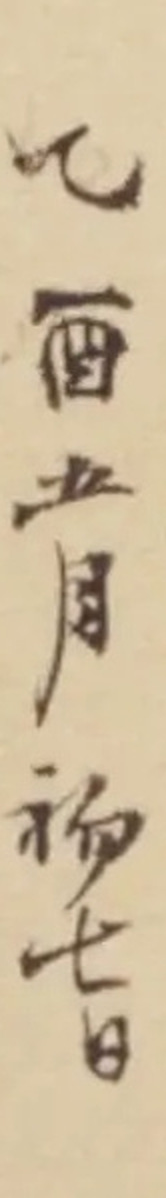乙酉五月初七日
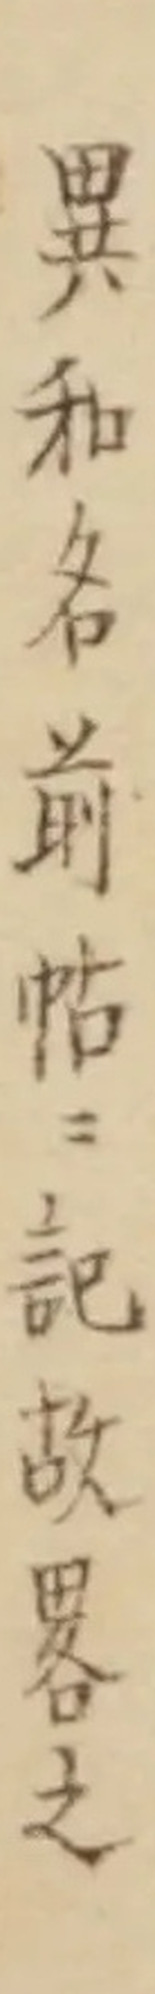異和名前帖に記故畧之
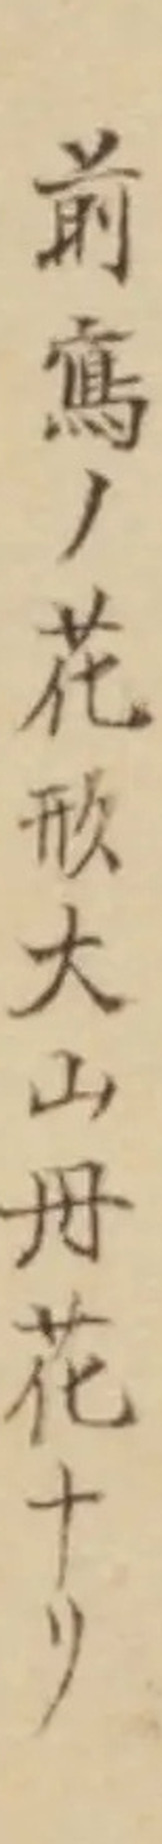前寫の花形大山丹花なり
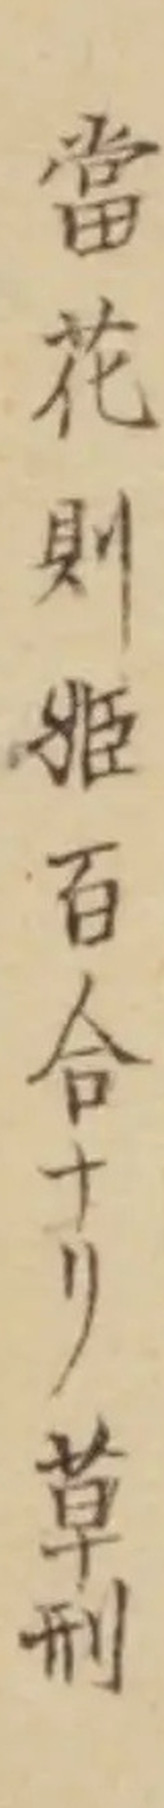當花則姫百合なり草刑

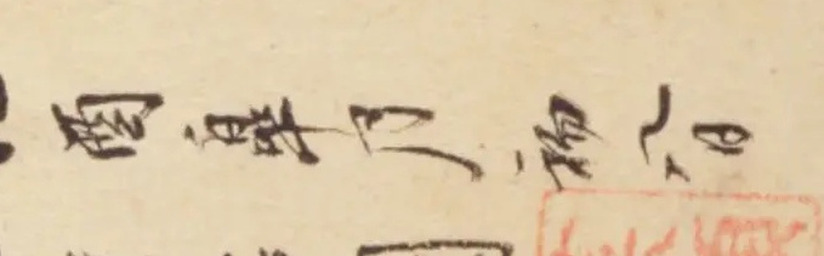乙酉皐月初八日
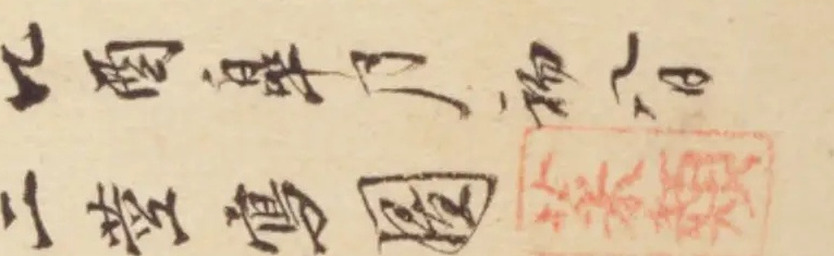乙酉皐月初八日
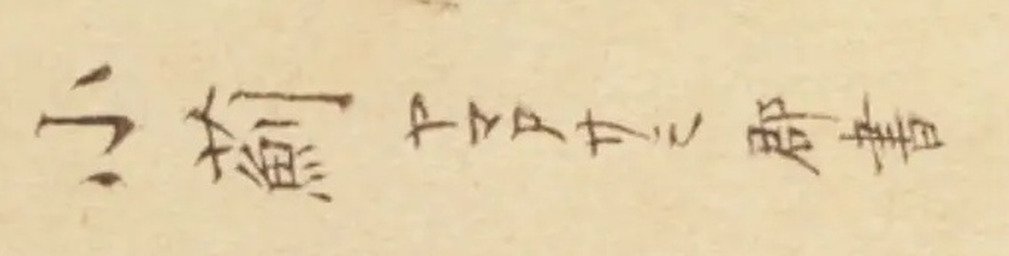小薊ヤマアサミ群書
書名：梅園草木花譜夏之部. 3
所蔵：国立国会図書館 National Diet Library, JAPAN
